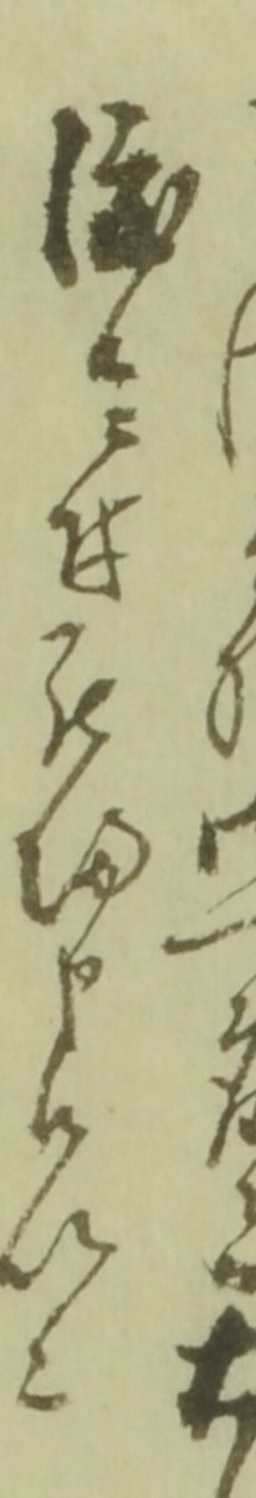渡候ニ付罷帰申候以上
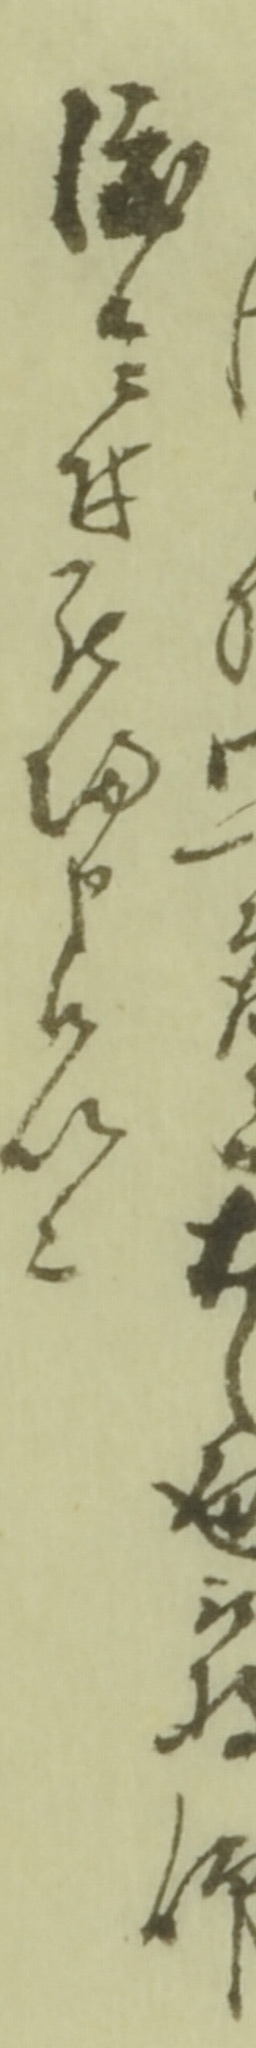渡候ニ付罷帰申候以上
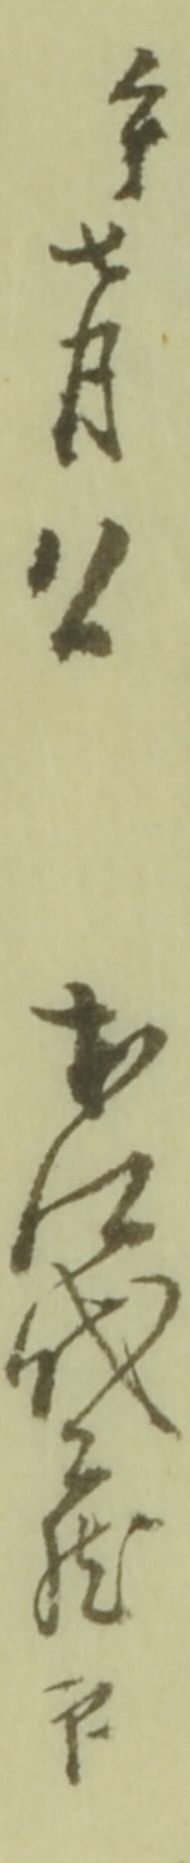午七月八日本郷代蔵印
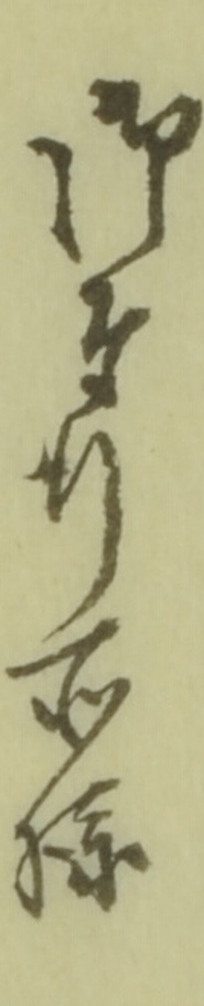御奉行所様
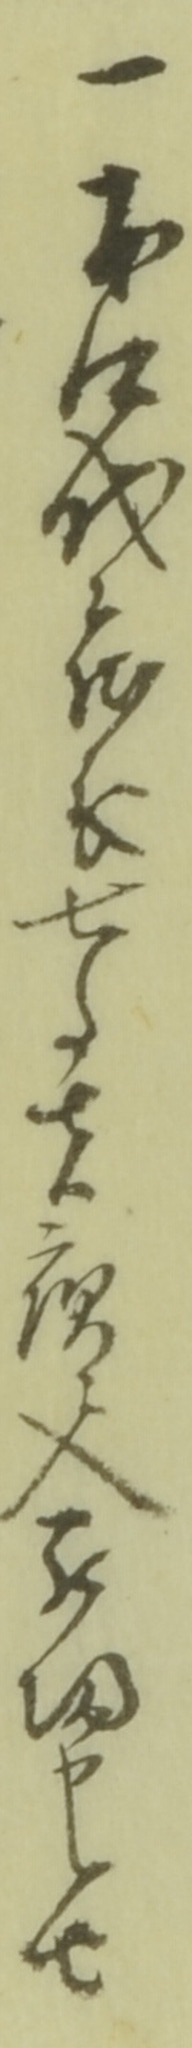一本郷代蔵義七月七日夜ニ入罷帰申候由
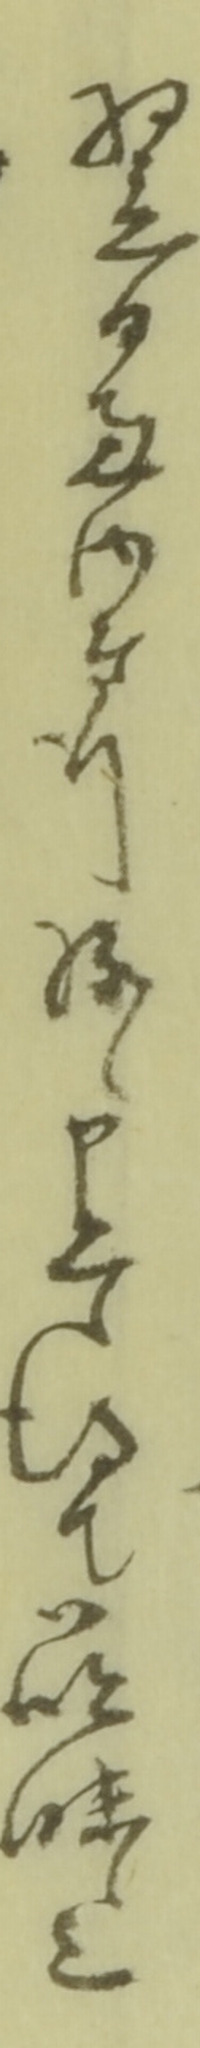翌日両御奉行様へ申上候得は御吟味之上
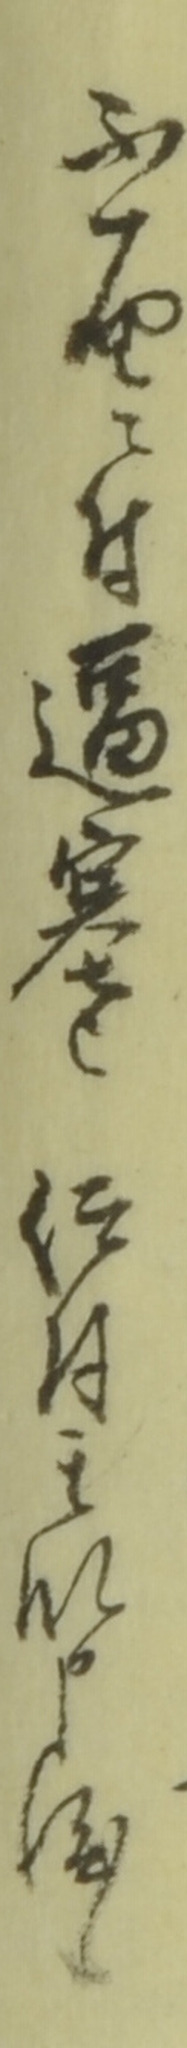不届二付逼塞被仰付其段申渡候
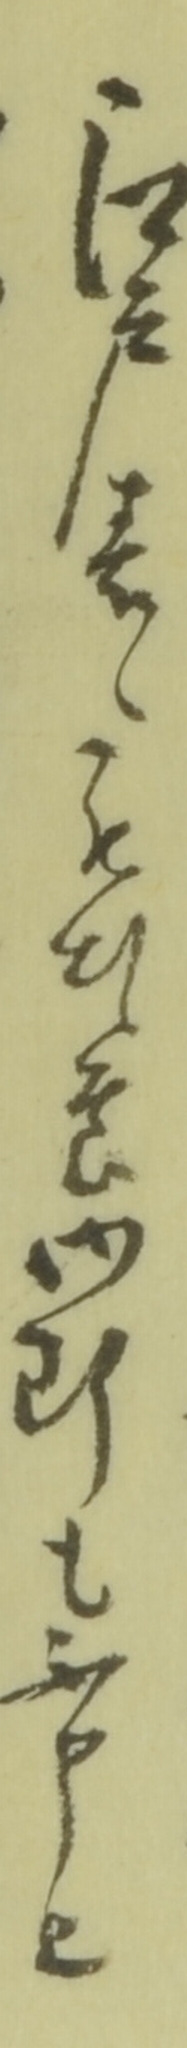江戸表へ罷出候節御断も不申上

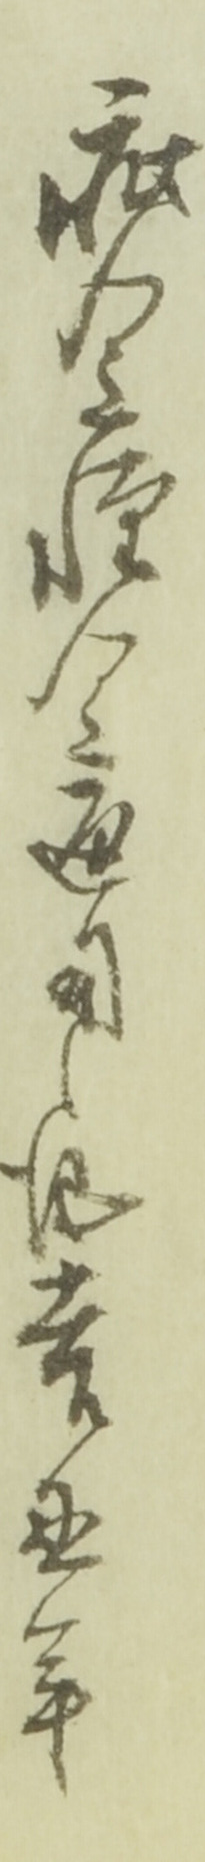金轉金通用候様去ル丑年
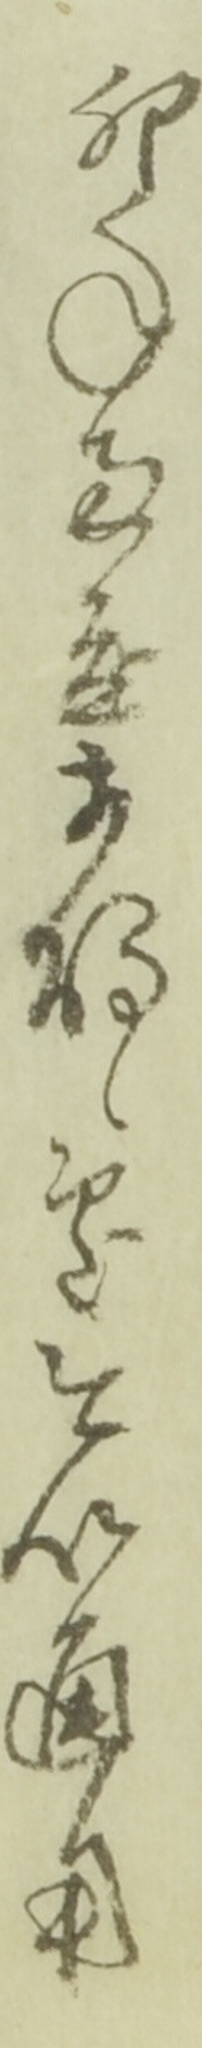卯年両替相触候處先以通用
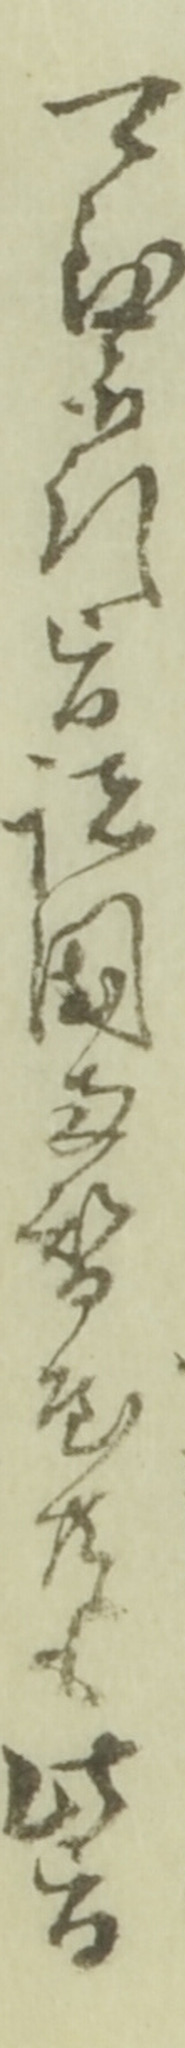可致取引候旨諸国両替屋共此旨
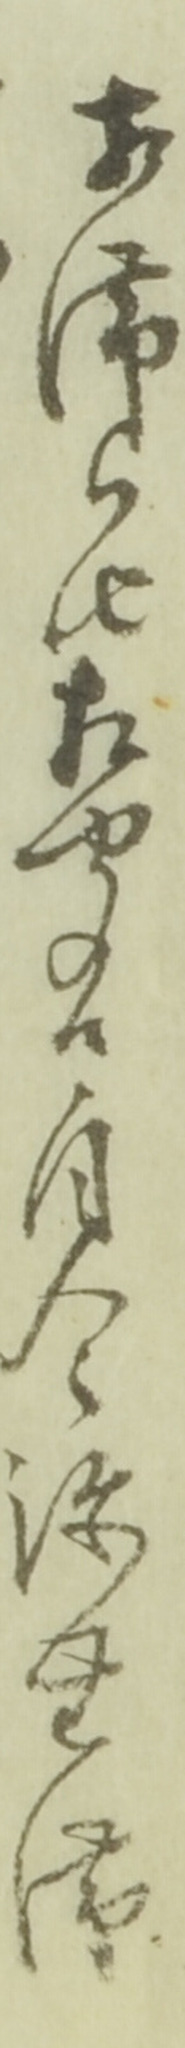相滞候由相聞候自今忝無滞
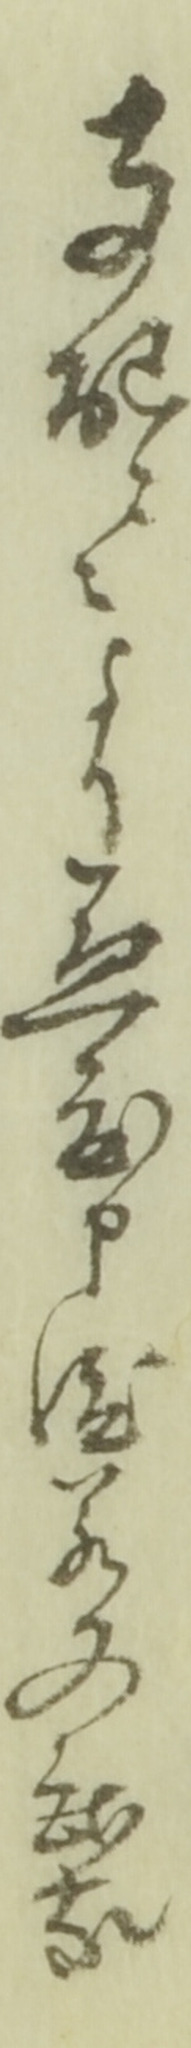支配ゝゝより急度申渡若又社家
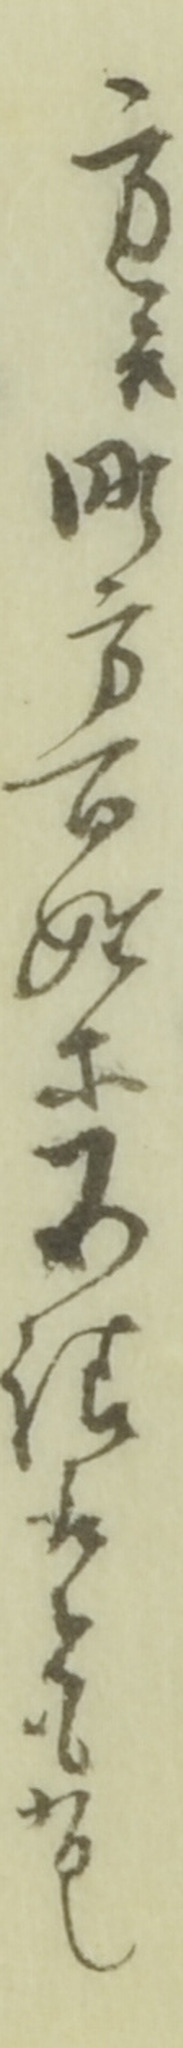方並町方百姓等不請取るとも有之
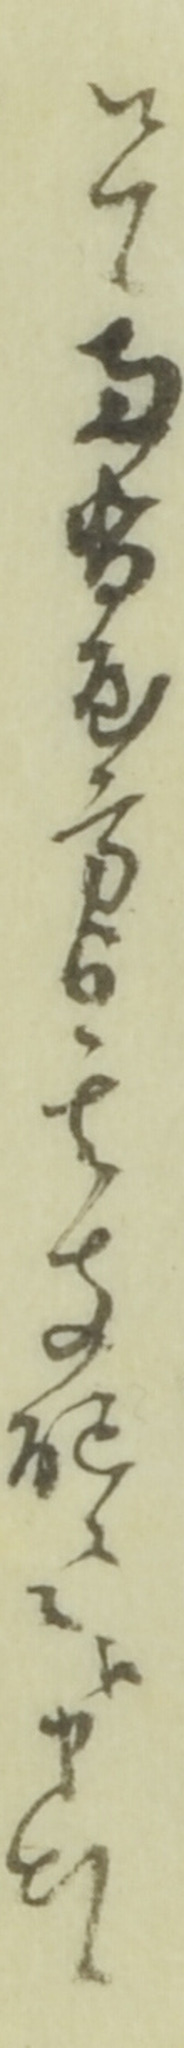候はは両替屋方より其支配ゝゝへ申付候
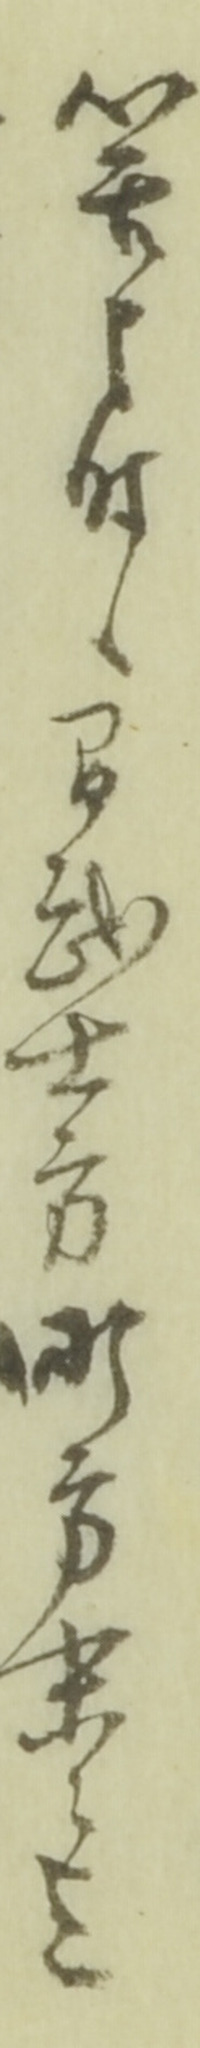筈申付候間武士方町方末々迄
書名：御公儀様御領主様御触書控
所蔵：伊那市立高遠町図書館・合同会社AMANE
